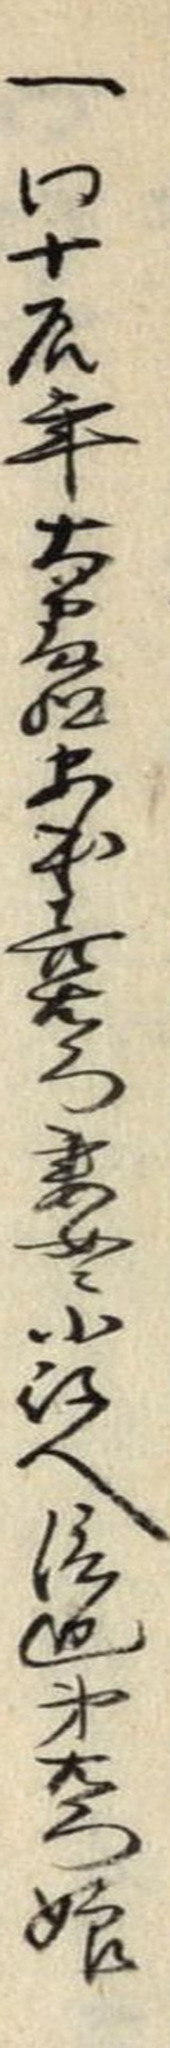一同十辰年大御番組安本喜右衛門妻女ニ小役人渡辺弟左衛門娘
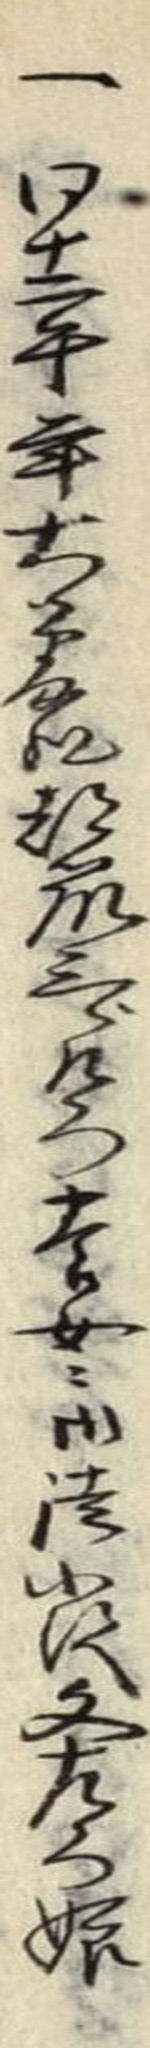一同十二午年大御番組都筑三郎左衛門養女ニ御徒小沢文左衛門娘
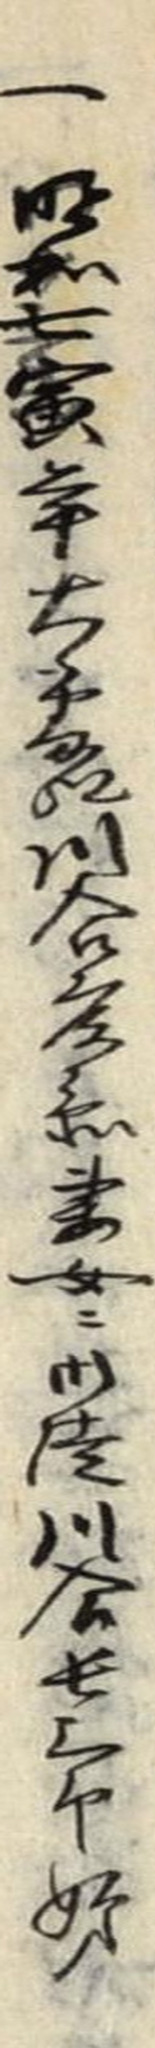一明和七寅年大御番組川合藤兵衛妻女ニ御徒川合長三郎姉
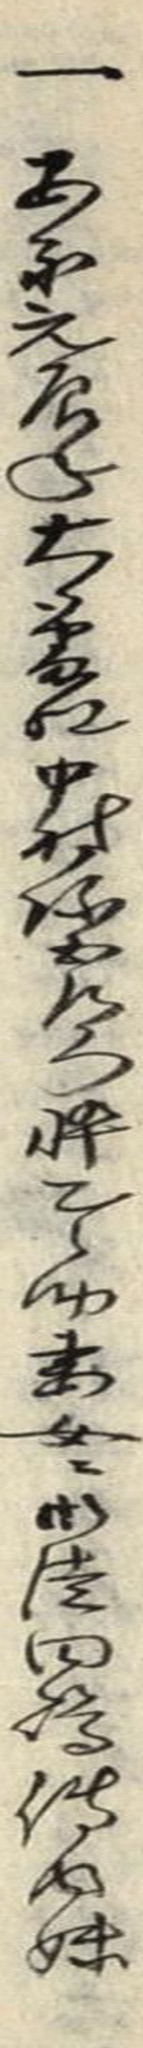一安永元辰年大御番組中村弥五左衛門倅乙之助妻女ニ御徒田嶋伝内妹
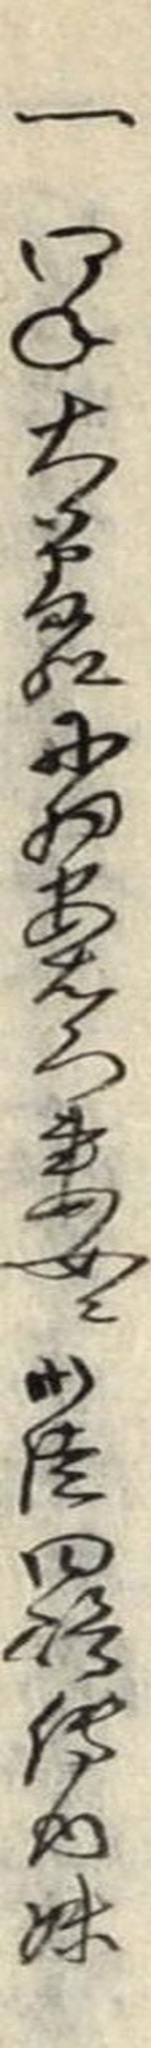一同年大御番組丹羽安右衛門妻女ニ御徒田嶋伝内妹
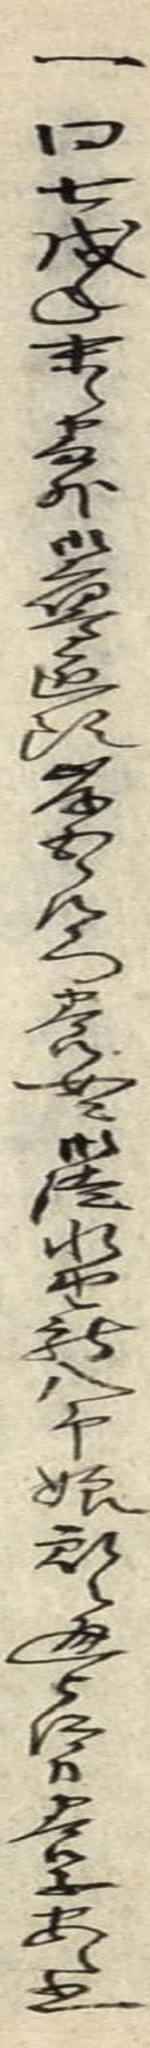一同七戌年末之番外御鷹匠頭岸五郎左衛門養女ニ御徒水野新八郎娘願之通被仰付養子安之丞
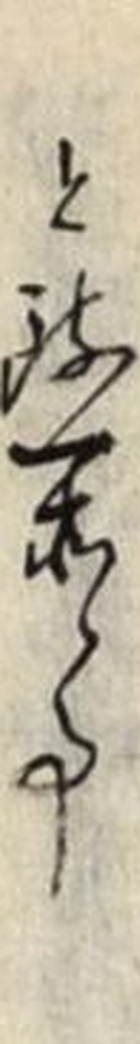と致一所候事
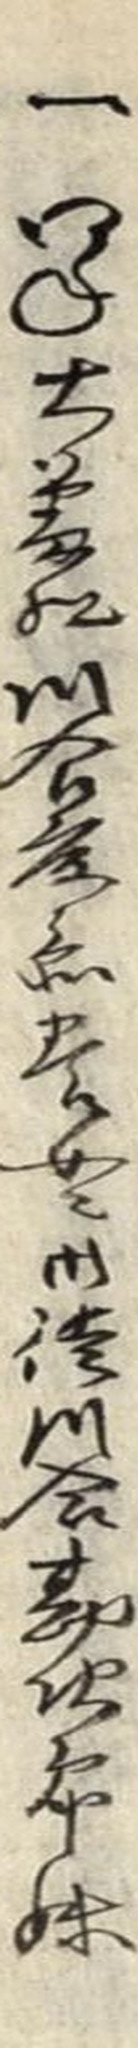一同年大御番組川合藤兵衛養女ニ御徒川合勘次郎妹
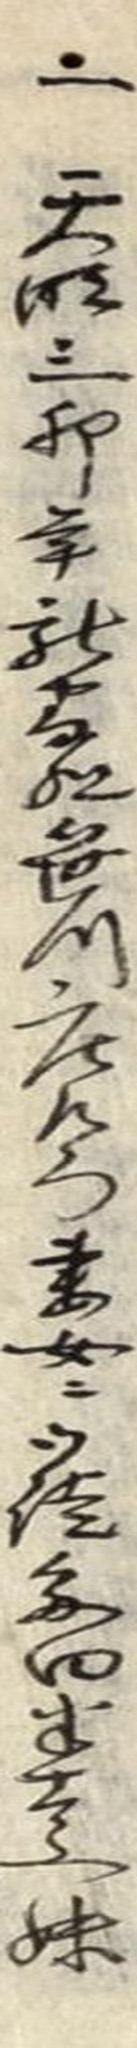一天明三卯年新番組笹川庄左衛門妻女ニ御徒多田半太夫妹
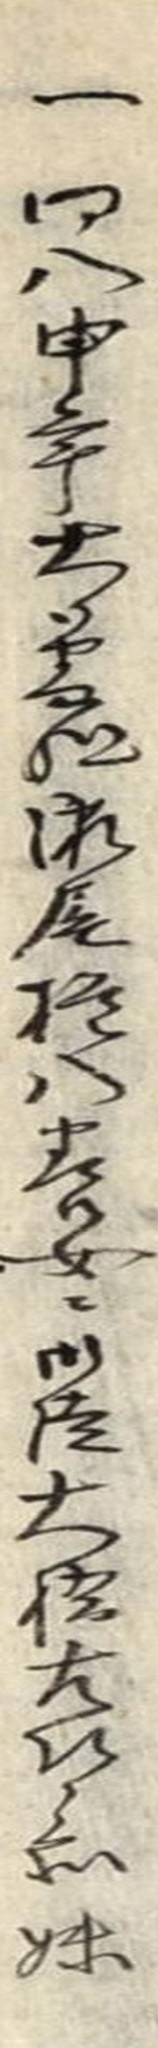一同八申年大御番組瀬尾権八養女ニ御徒大橋左次兵衛妹
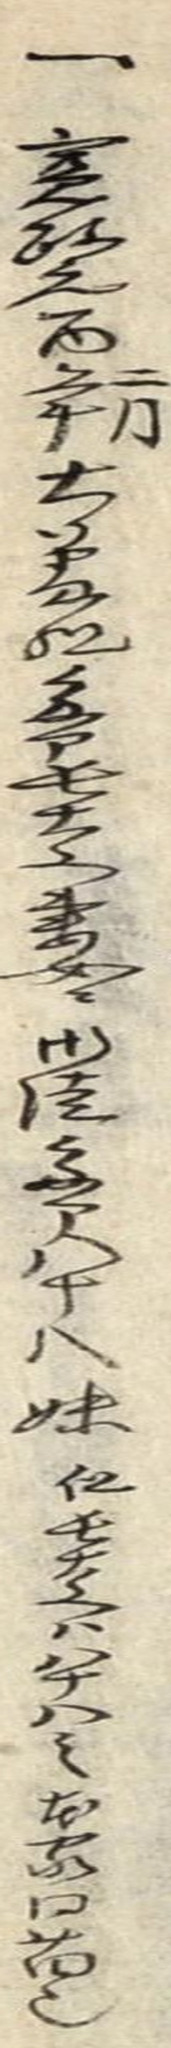一寛政元酉年二月大御番組多部長太夫妻女ニ御徒多部八十八妹但長太夫ハ八十八之本家同苗也
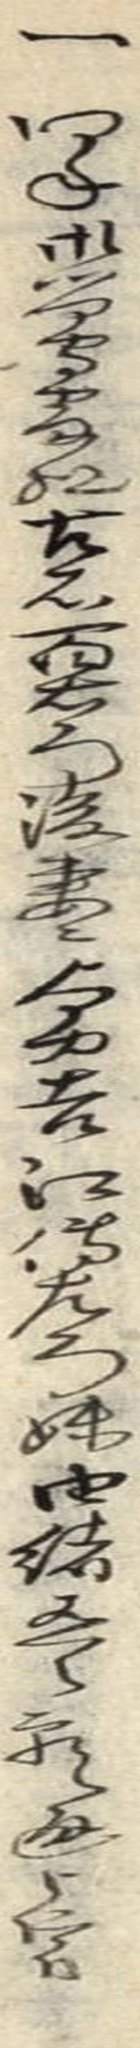一同年御留守番組古石百右衛門後妻ニ与力吉江伝左衛門妹由緒有之願之通被仰付
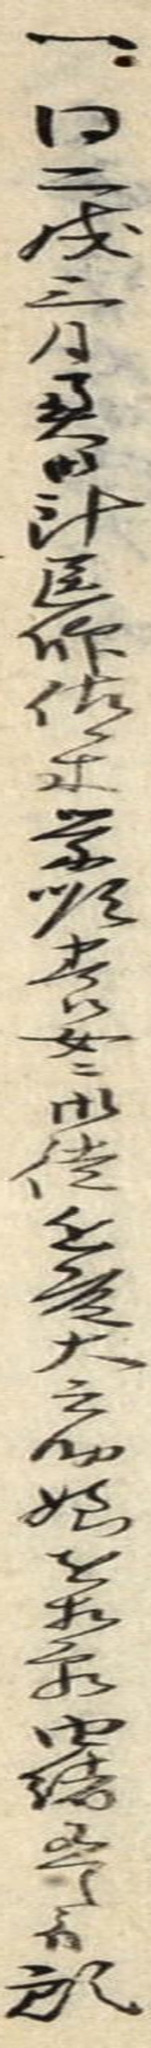一同ニ戌三月奥御針医師佐々木栄順養女ニ御徒近藤大之助娘を相願由緒有之ニ付願

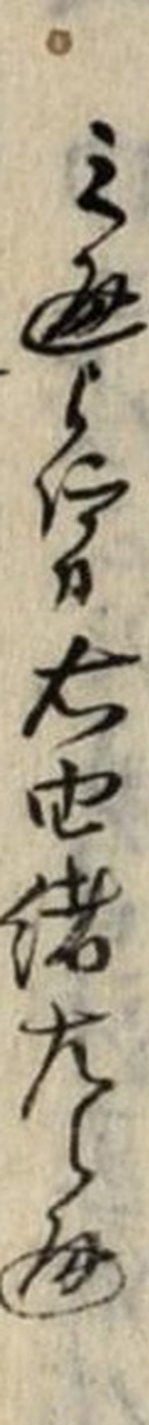之通被仰付右由緒左之通
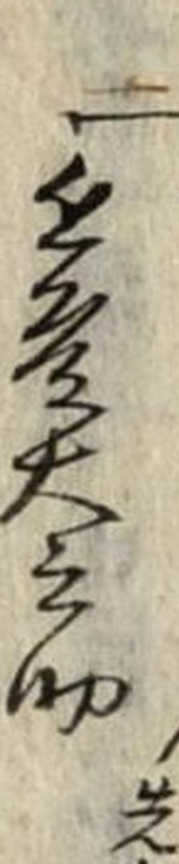近藤大之助
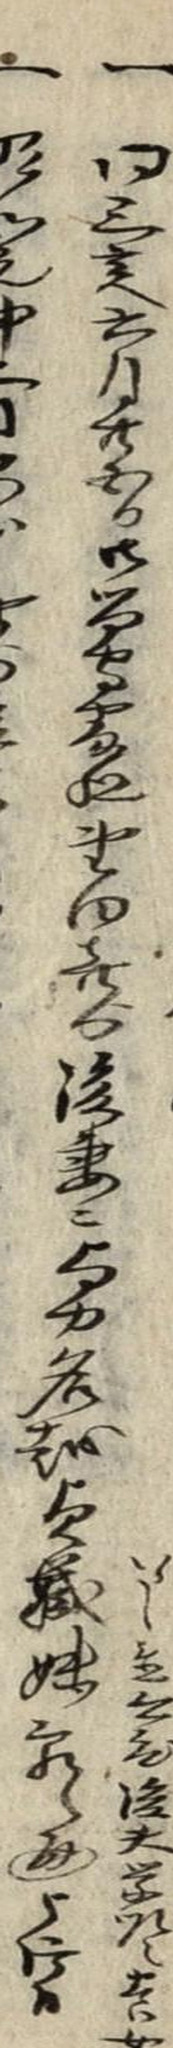一同三亥六月廿五日御留守番組野田喜右衛門後妻ニ与力名越貞蔵妹願之通被仰付
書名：養子縁組之部
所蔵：福井県文書館 Fukui Prefectural Archives
